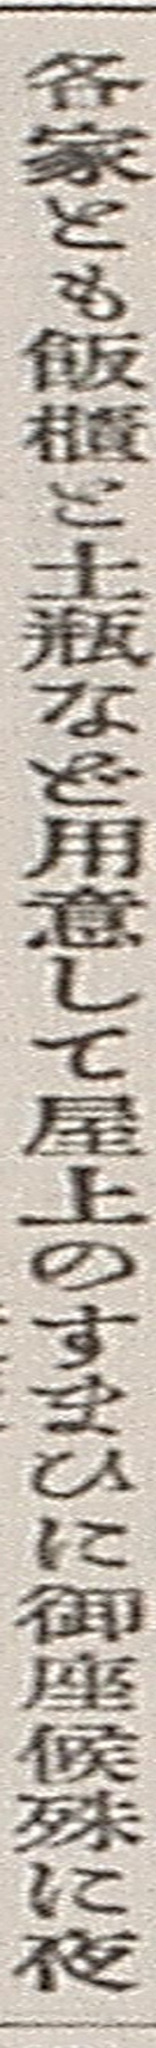各家とも飯櫃と土瓶など用意して屋上のすまひに御座候殊に夜
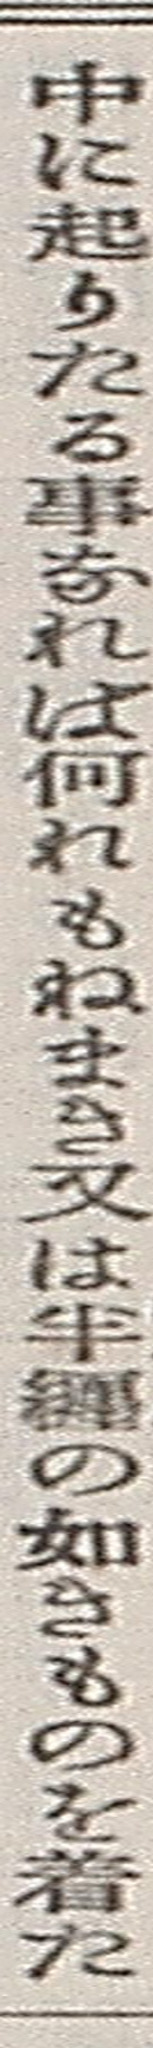中に起りたる事なれば何れもねまき又は半纏の如きものを着た
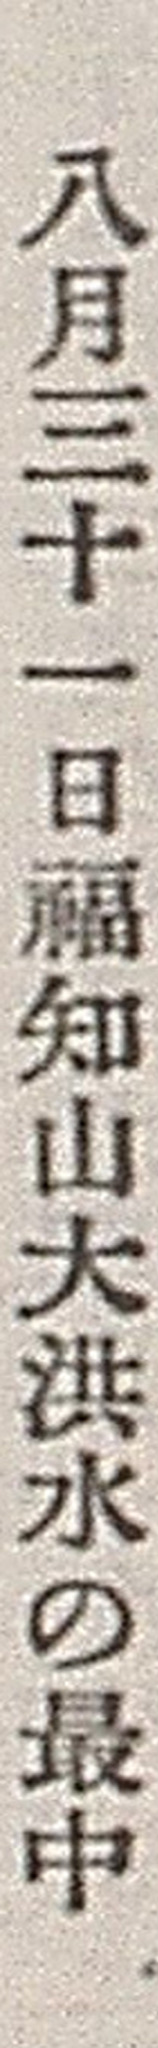八月三十一日福知山大洪水の最中弥吉
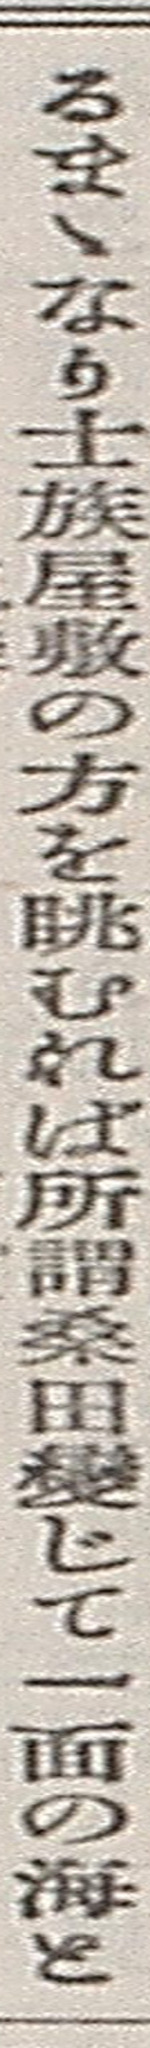るまゝなり士族屋敷の方を眺むれば所謂桑田変じて一面の海と
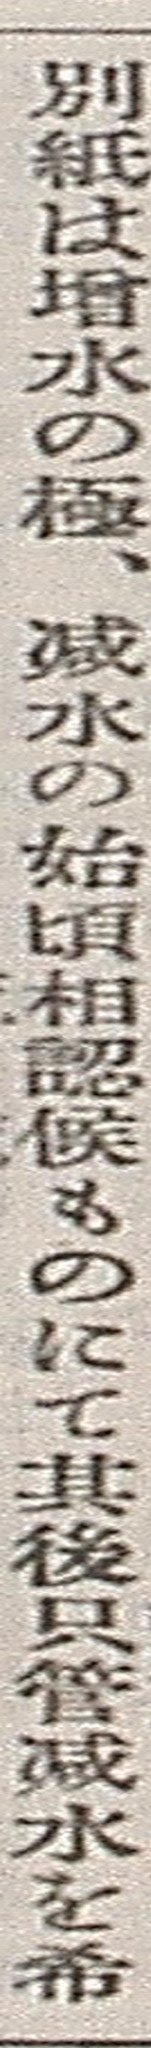別紙は増水の極、減水の始頃相認候ものにて其後只管減水を希
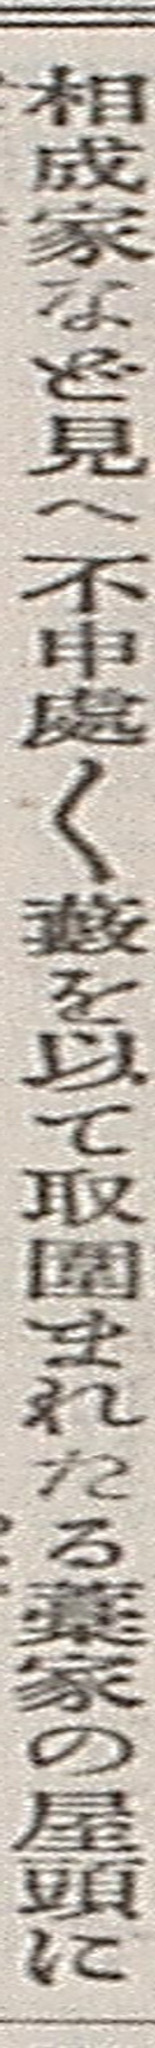相成家など見へ不申処〳〵藪を以て取圍まれたる藁家の屋頭に
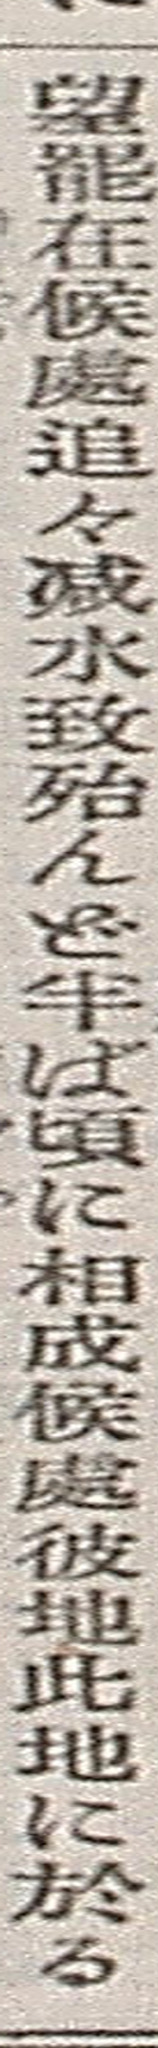望罷在候処追々減水致殆んど半ば頃に相成候処彼地此地に於る
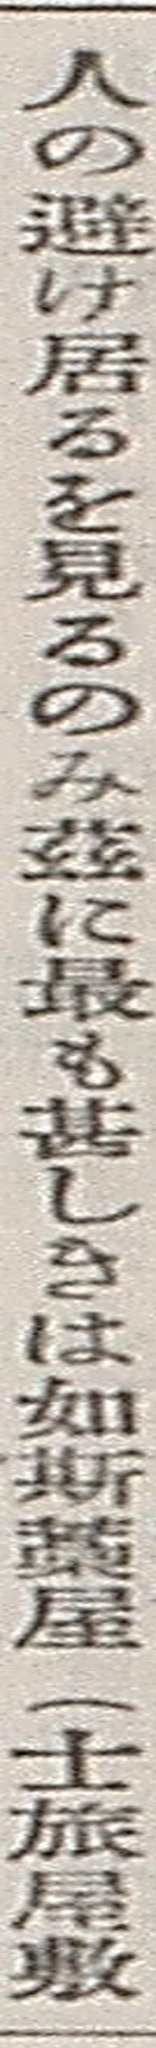人の避け居るを見るのみ茲に最も甚しきは如斯藁屋（士族屋敷
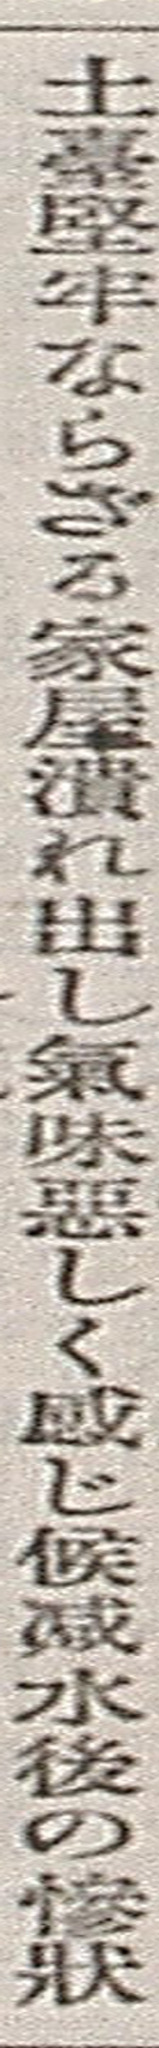土台堅牢ならざる家屋潰れ出し気味悪しく感じ候減水後の惨状
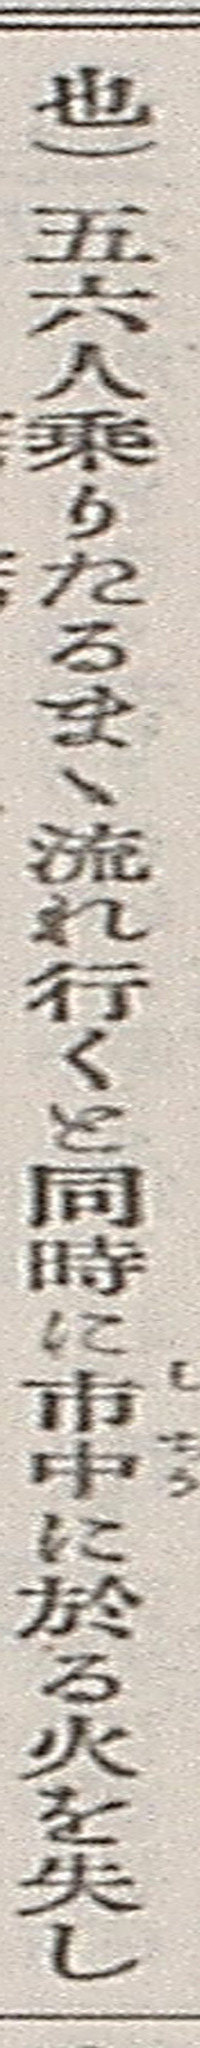也）五六人乗りたるまゝ流れ行くと同時に市中に於る火を失し
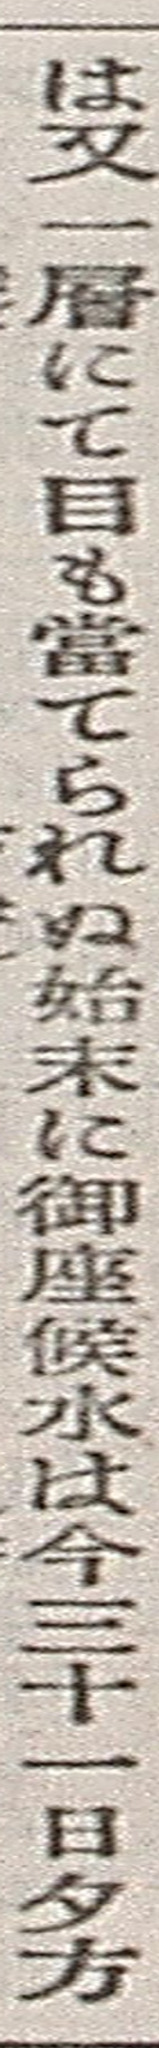は又一層にて目も当てられぬ始末に御座候水は今三十一日夕方
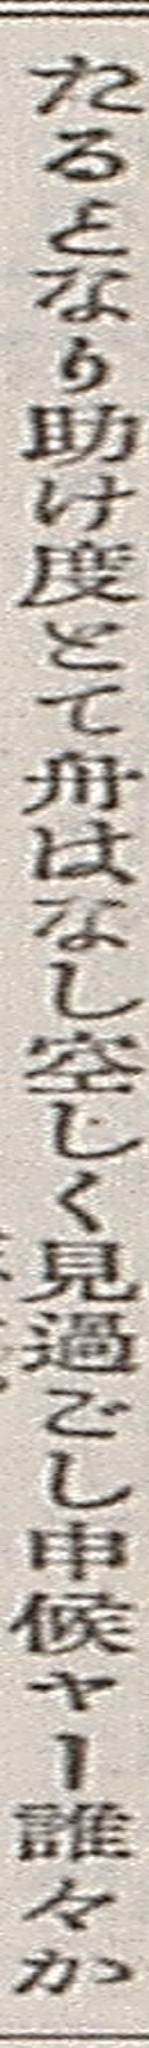たることなり助け度とて舟はなし空しく見過ごし申候ヤー誰々か
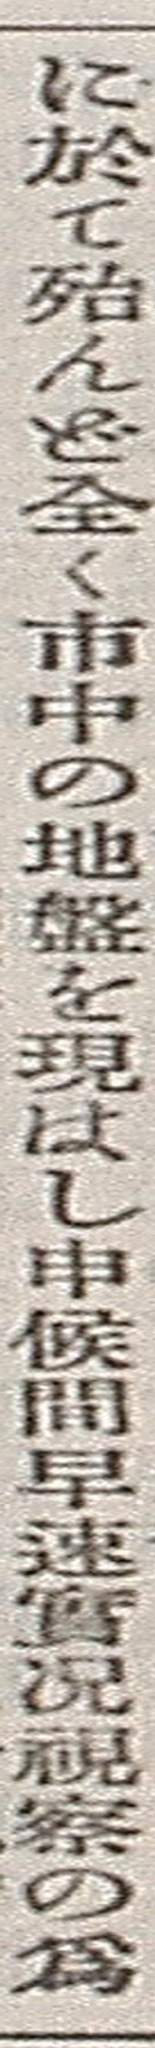に於て殆ど全く市中の地盤を現はし申候間早速実況視察の為
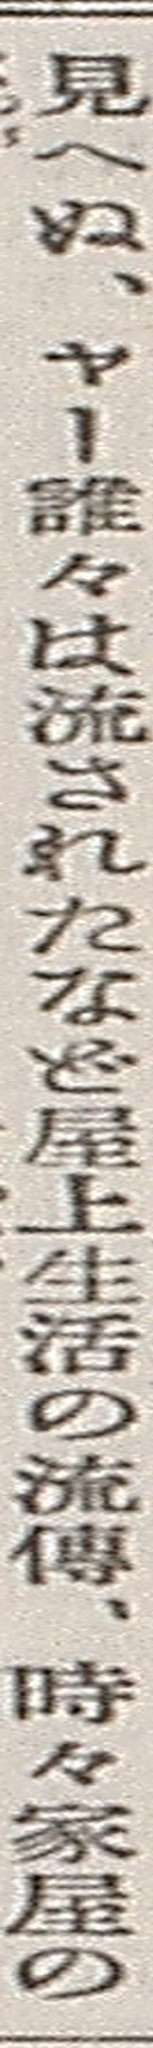見へぬ、ヤー誰々は流されたなど屋上生活の流伝、時々家屋の
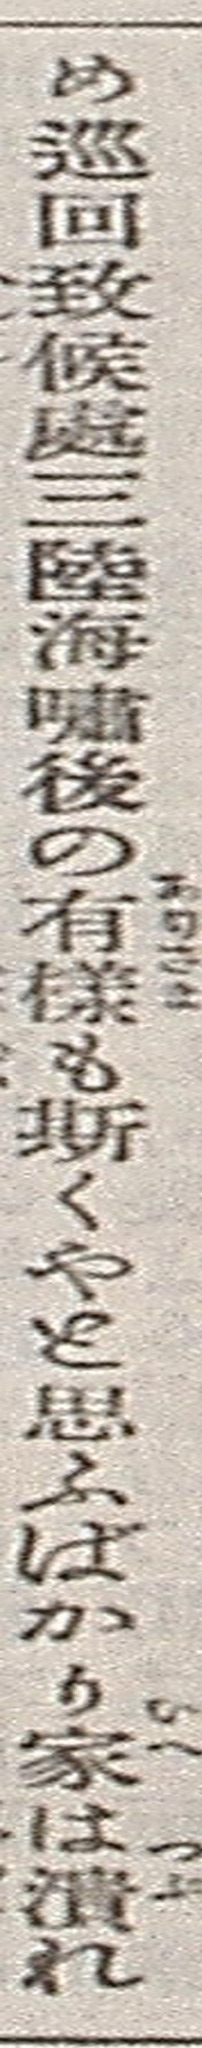め巡回致候処三陸海嘯後の有様も斯くやと思ふばかり家は潰れ
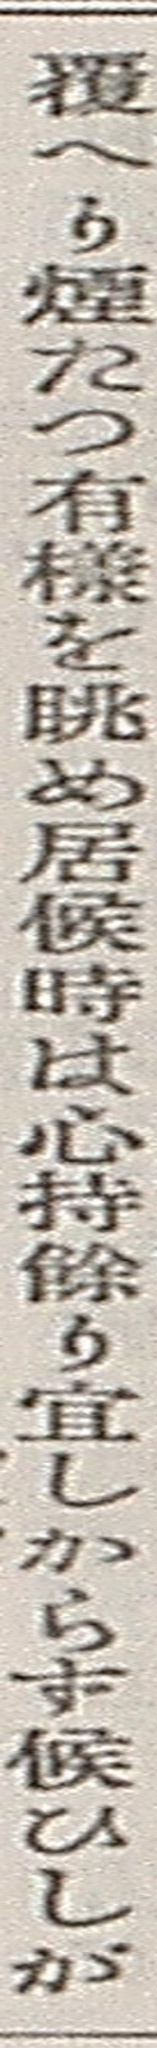覆へり煙たつ有様を眺め居候時は心持餘り宜しからず候ひしが
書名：風俗畫報臨時増刊第百二十六號　洪水被害録（中）
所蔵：東京大学地震研究所図書室 Earthquake Research Institute Library, The University of Tokyo, JAPAN
